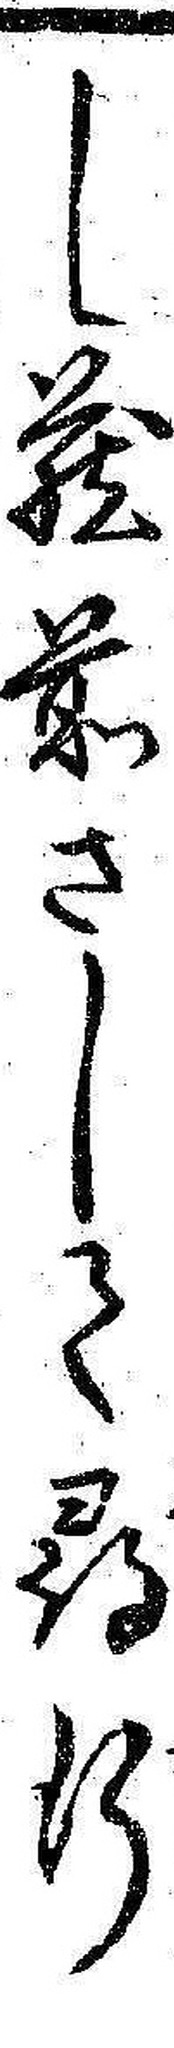し蔵前さして尋行
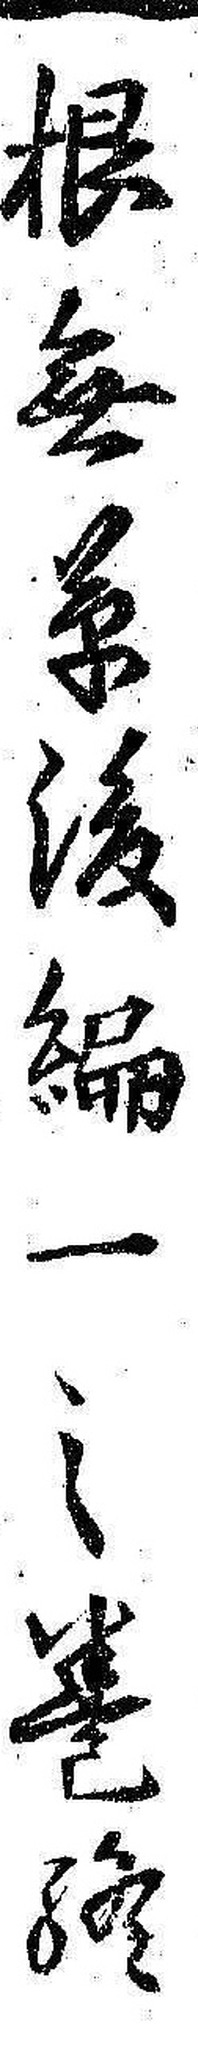根無草後編一之巻終

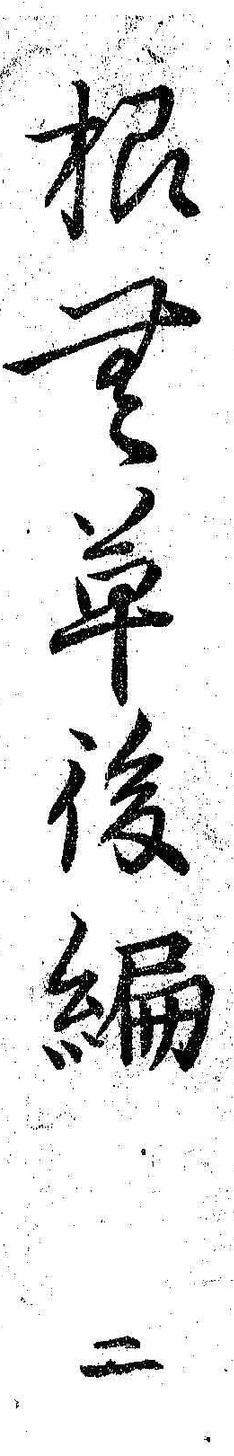根無草後編二

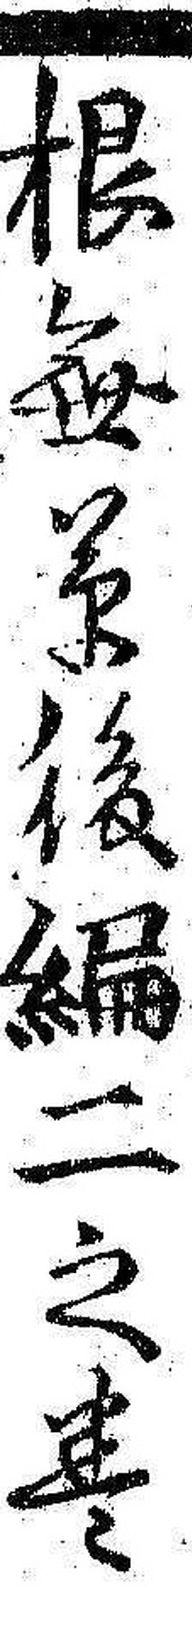根無草後編二之巻
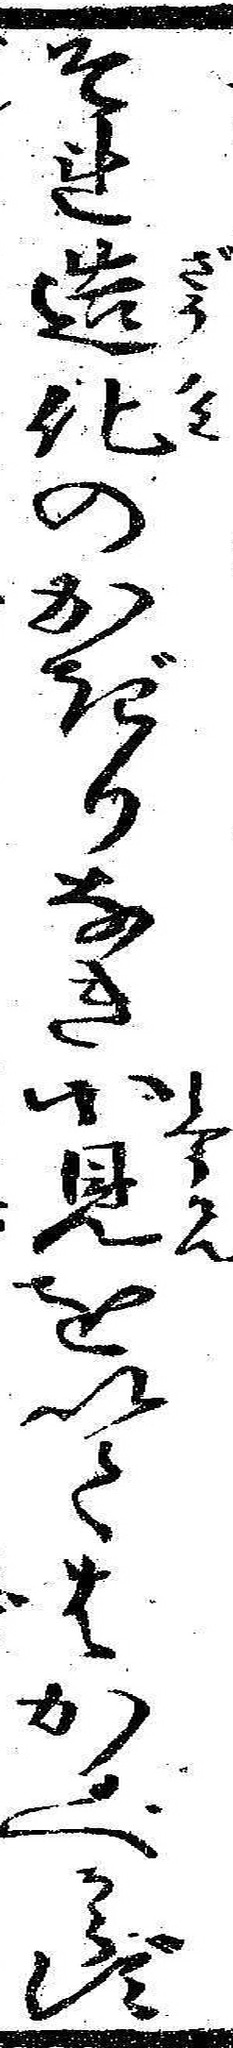それ造化のかぎりなき小見をにてはかるべからず
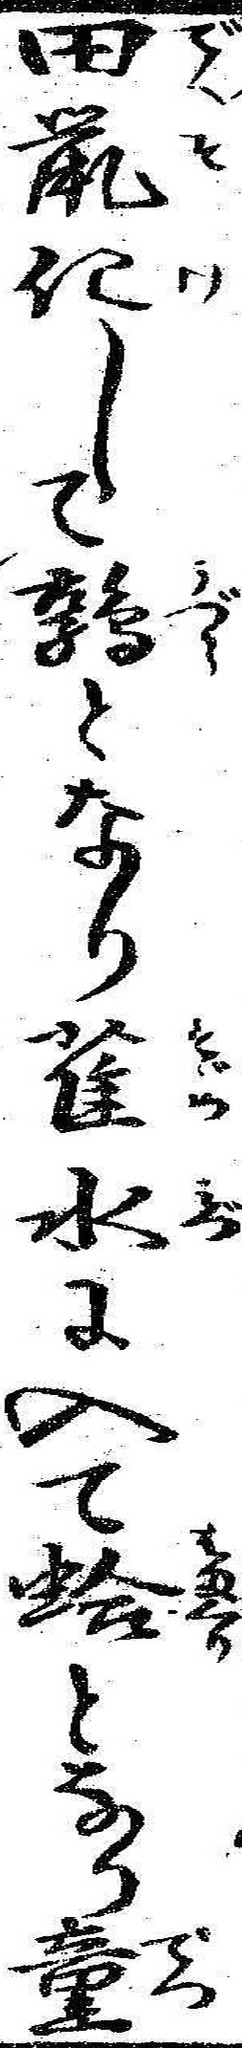田鼠化して鶉となり雀水に入て蛤となり童
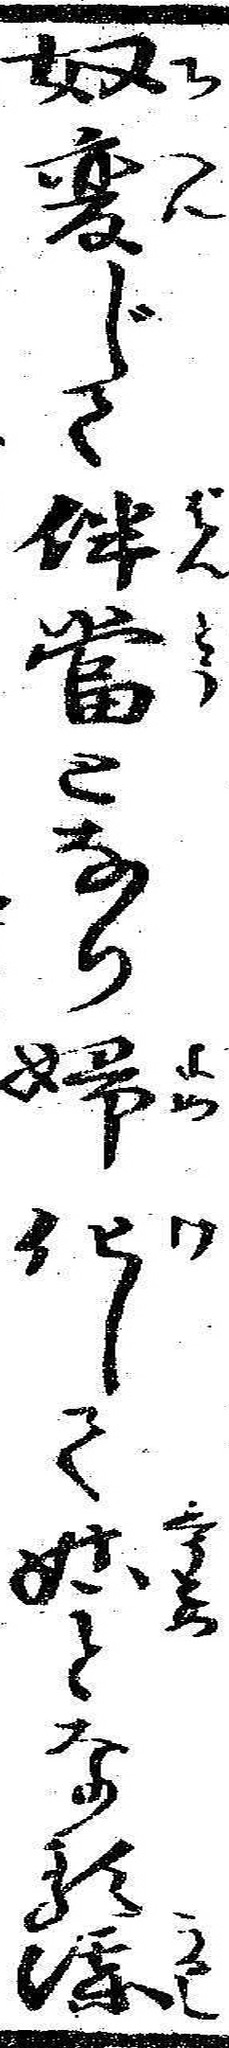奴変じて伴当となり嫁化して姑となる漆
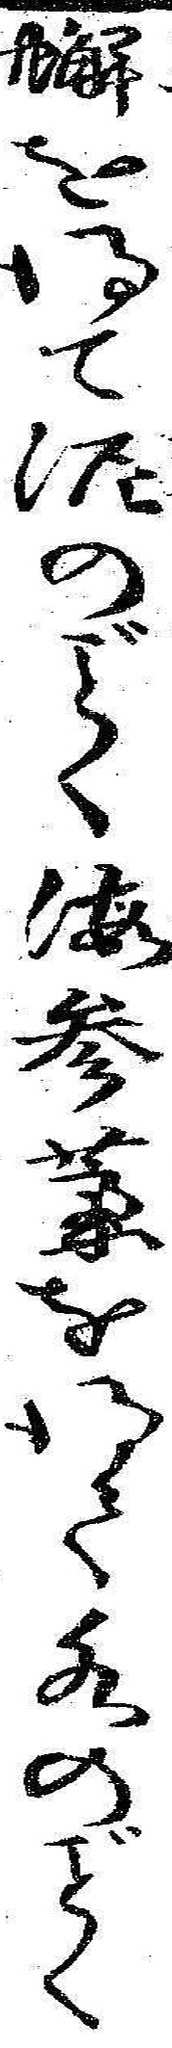蟹を得て泥のごとく海参藁を得て水のごとく
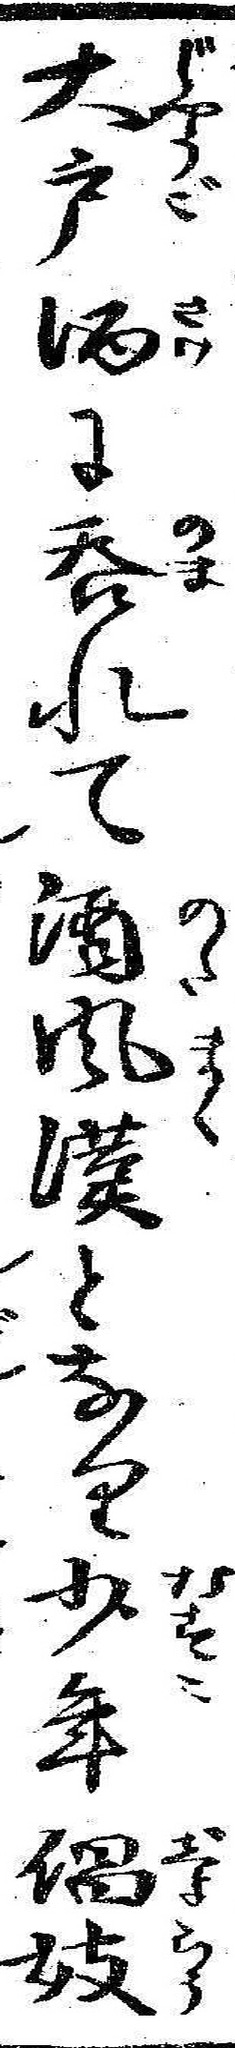大戸酒に呑れて酒風漢となり少年倡妓
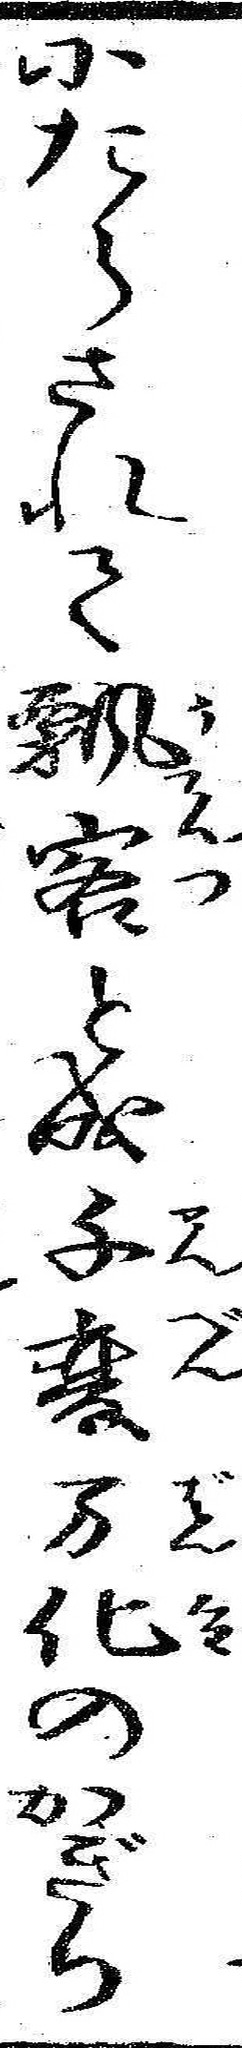にたらされて飄客と成千変万化のかぎり
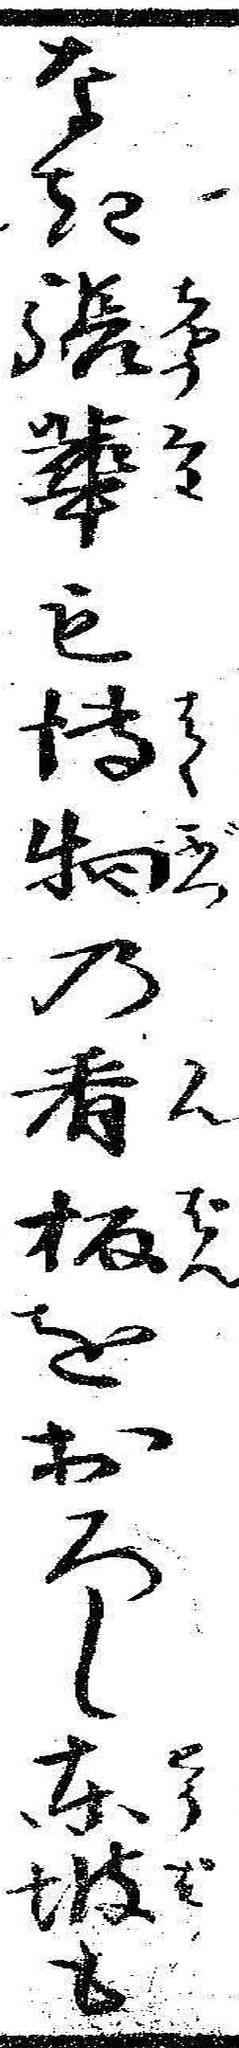なき張華も博物の看板をおろし東坡も
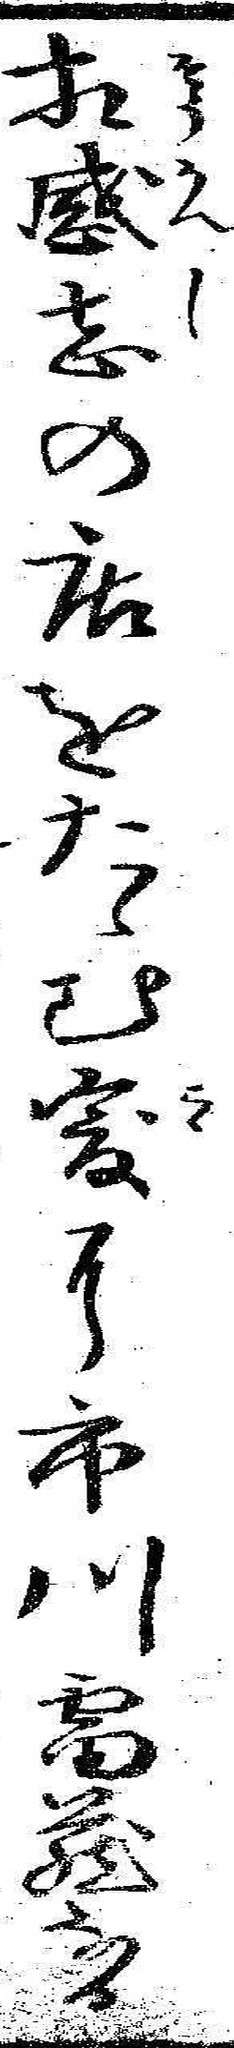相感志の店をたゝむ爰に市川雷蔵なる
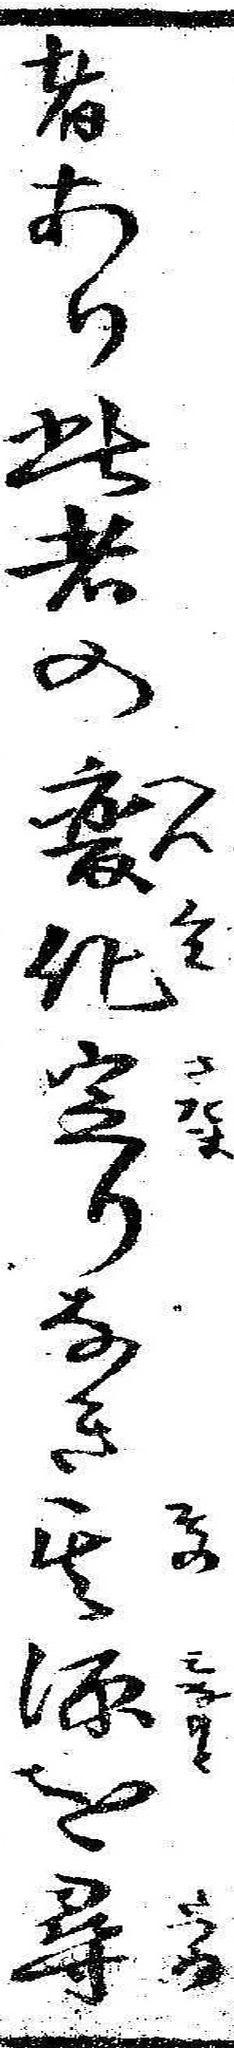者あり此者の変化定りなき其源を尋

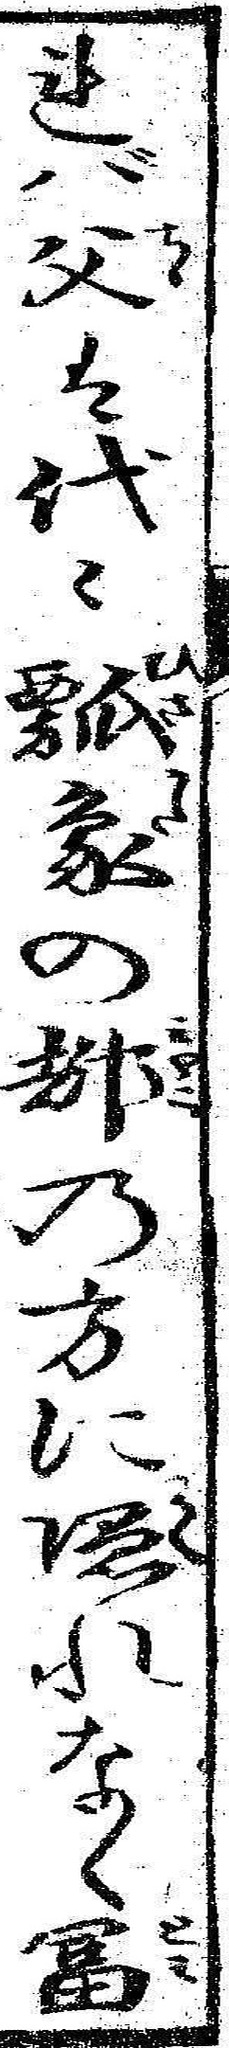れば父は代々瓢象の都の方に隠れなく富
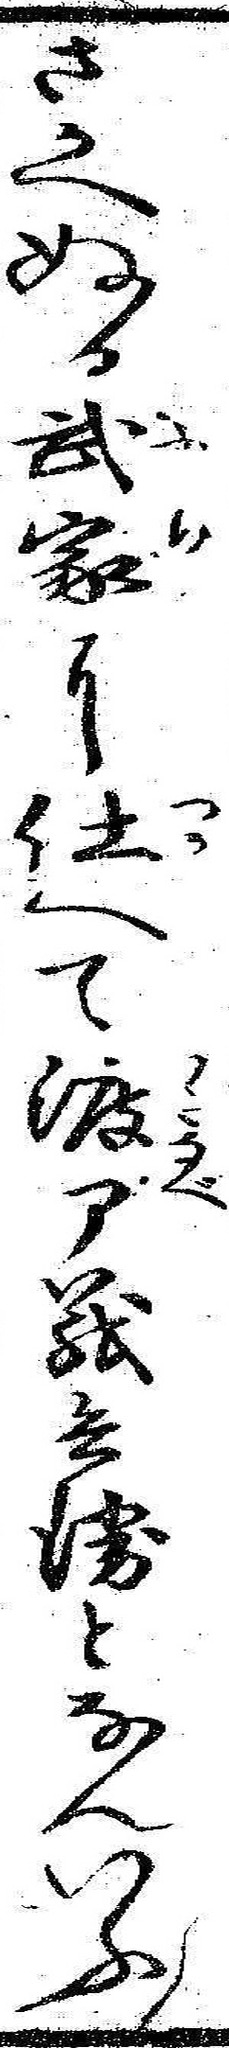さかへぬる武家に仕へて渡部義兵衛となんいふ
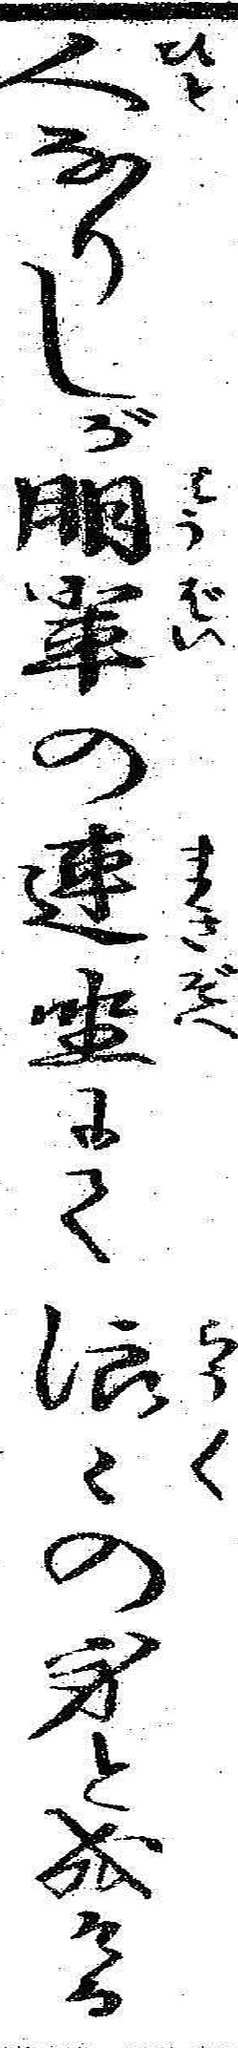人なりしが朋輩の連坐にて浪々の身と成ける
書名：根無草後編
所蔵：国文学研究資料館
